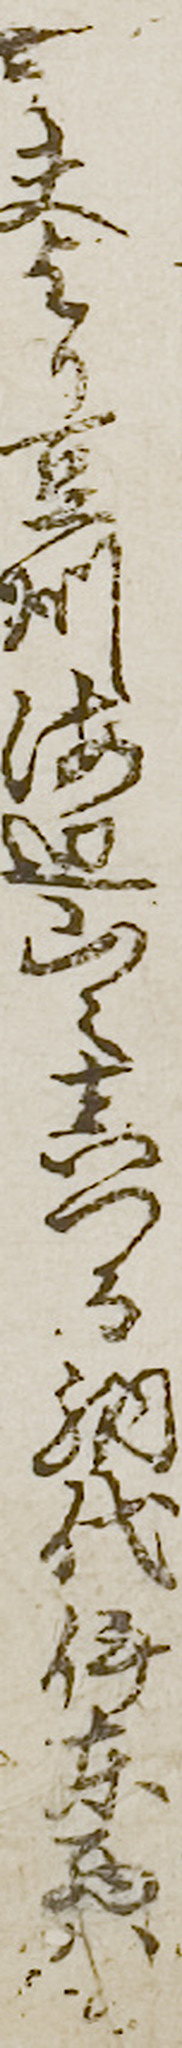夫より豆州海辺山〻真つる網代伊東西ハ
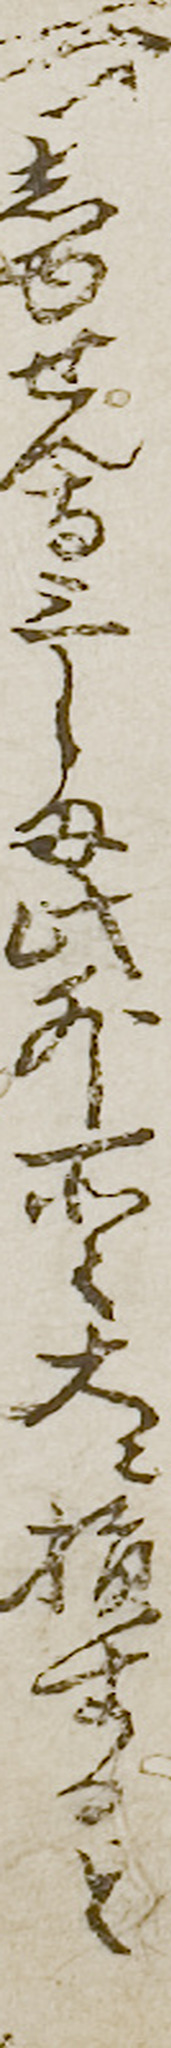しゆせん寺三しま此外所〻大ニ損すると
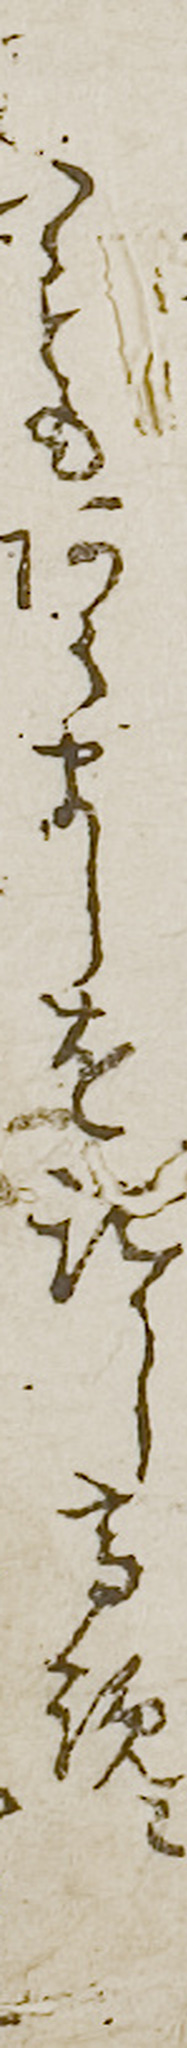いふともあらましを記し高覧ニ
